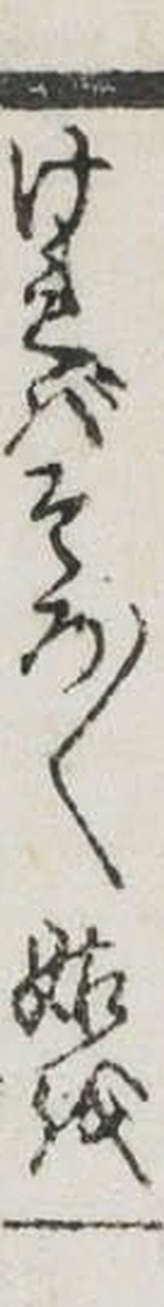ければそろ〳〵姑を
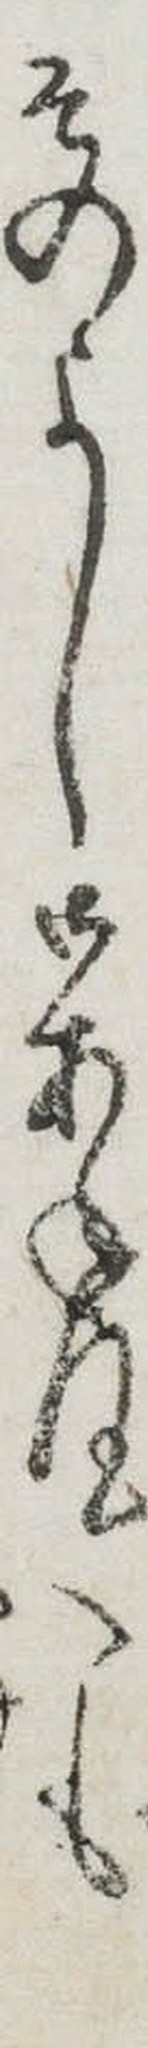そのよし御あねさまへも
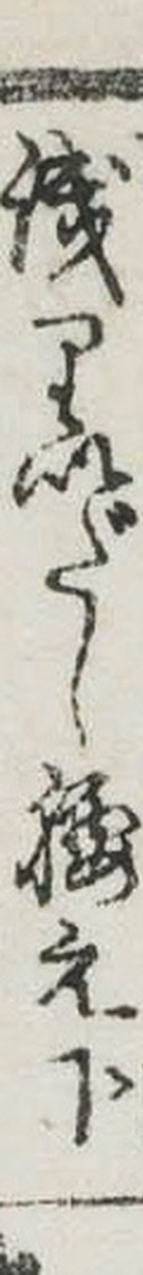譏りいだし腰元下
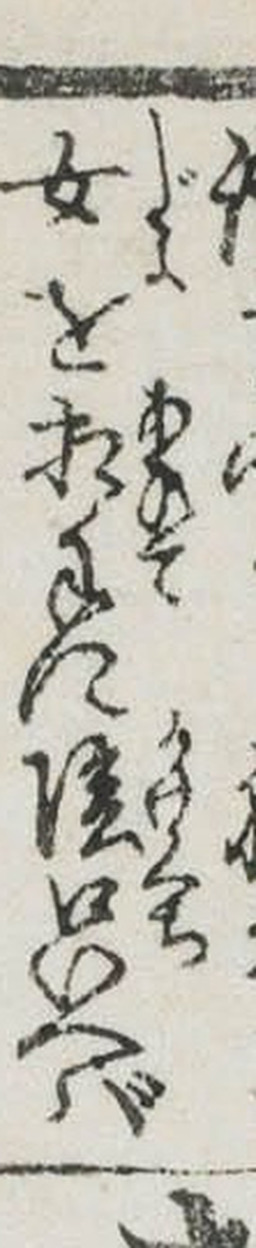女を相手に陰口いへば
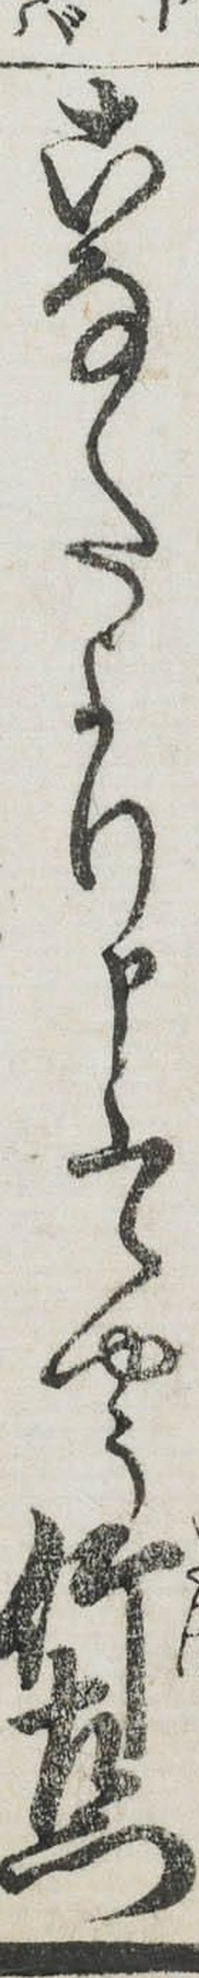こなたより申上候やう竹左衛門
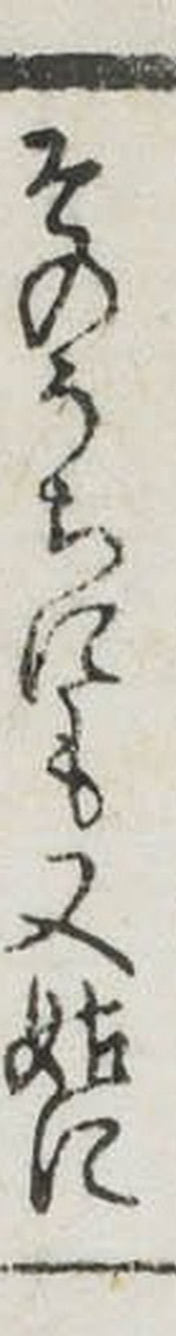そのうちにも又姑に
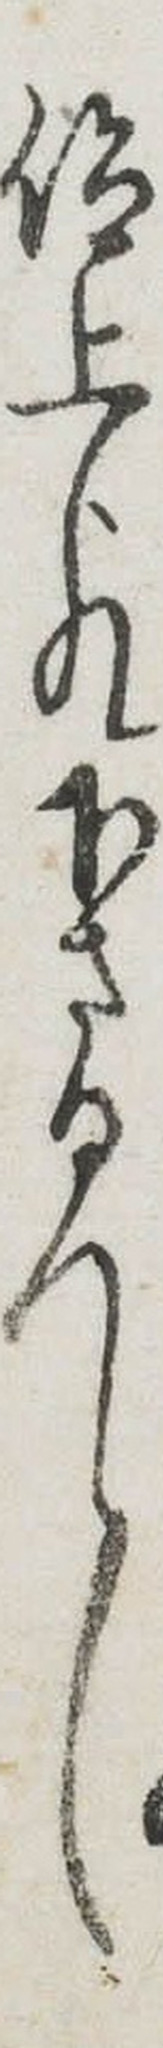仰上られ下さるへく候
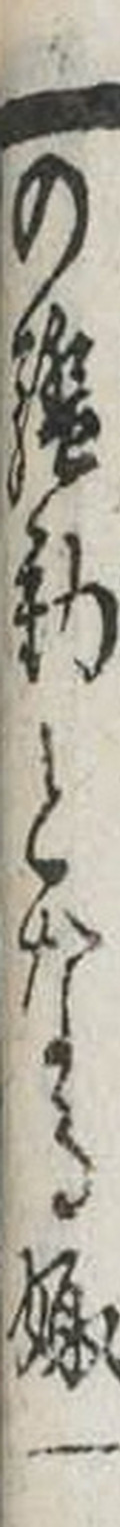の騒動となる娵
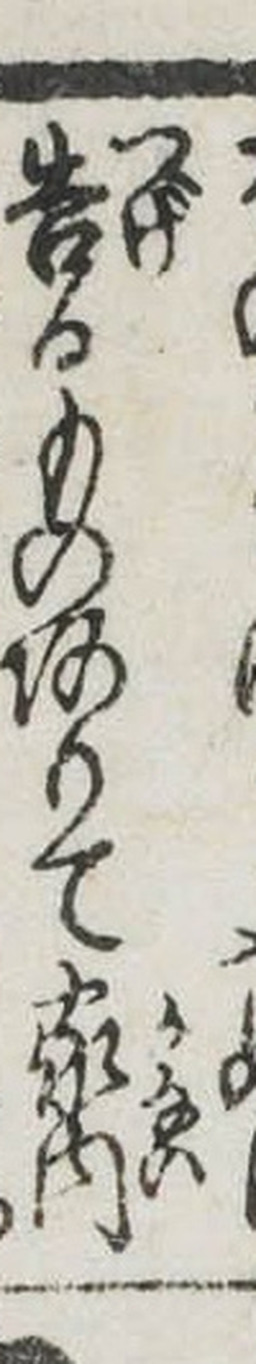告るものありて家内
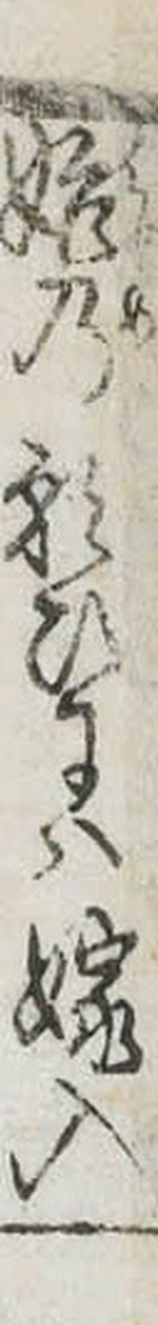始の願ひには嫁入
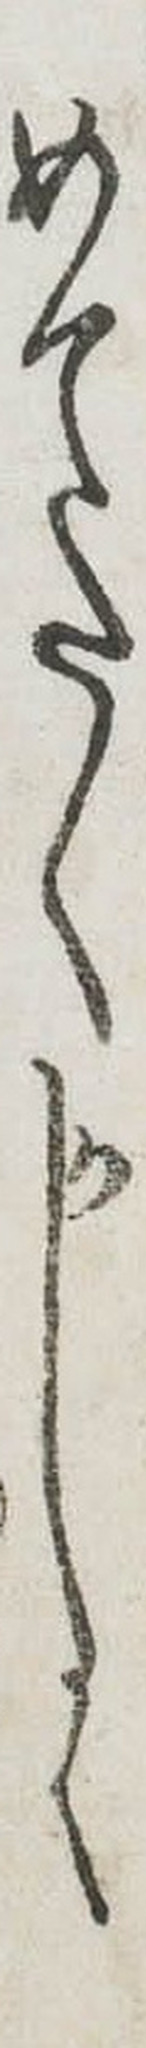めてたくかしく
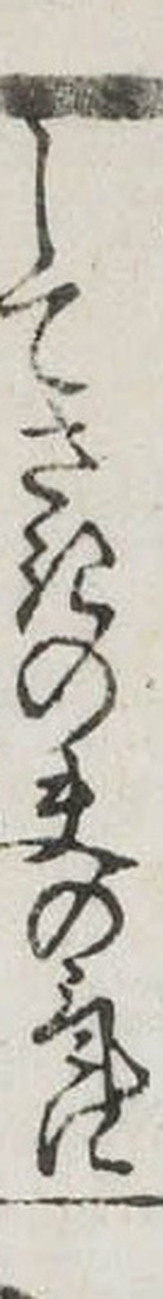してさきの夫の気に
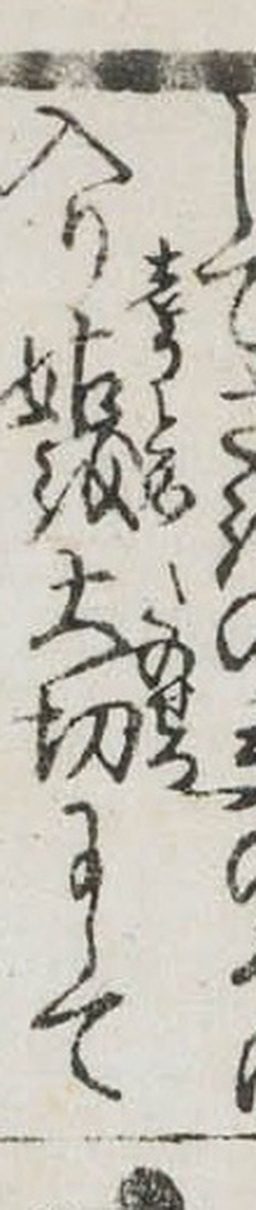入り姑を大切にして
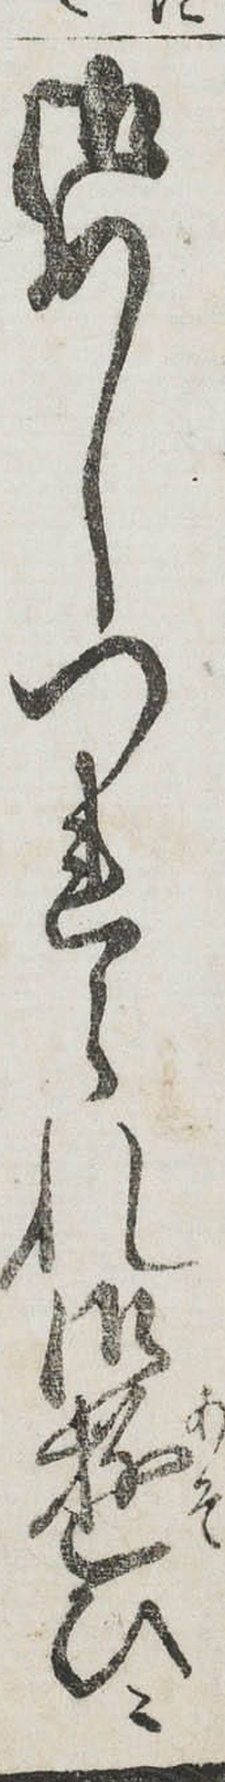御めしつれられ御遊ひに
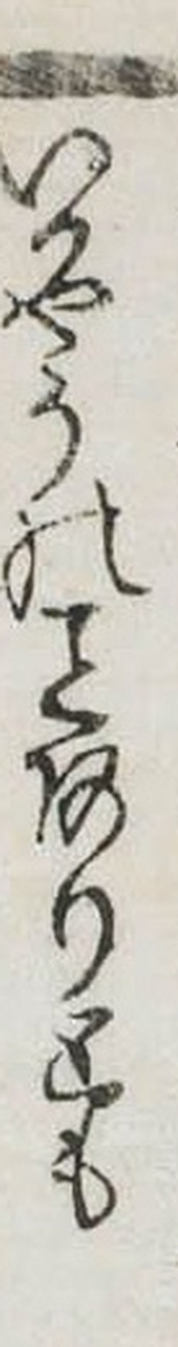いかやうのことありとも
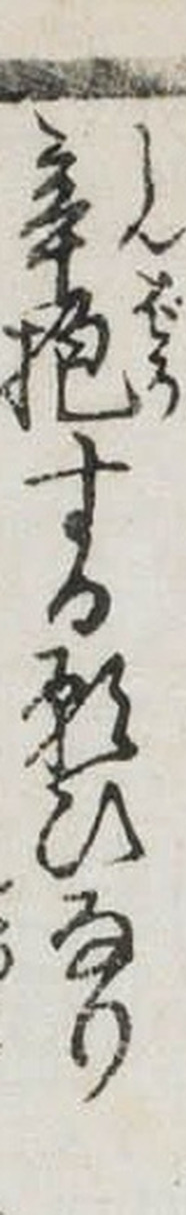辛抱する願ひなり
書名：頭書萬用婦人手紙之文言
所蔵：東京学芸大学教育コンテンツアーカイブ
